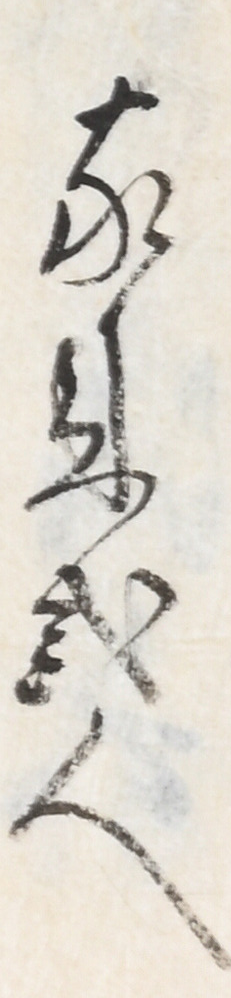家来壱人
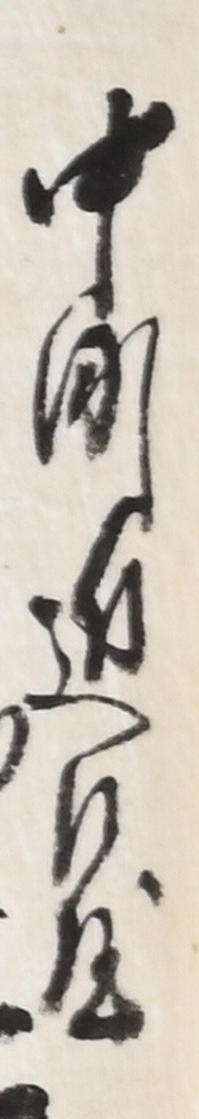中町近江屋
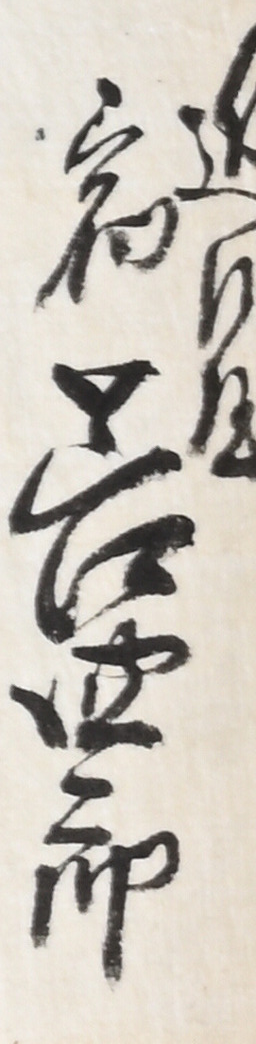宿善四郎
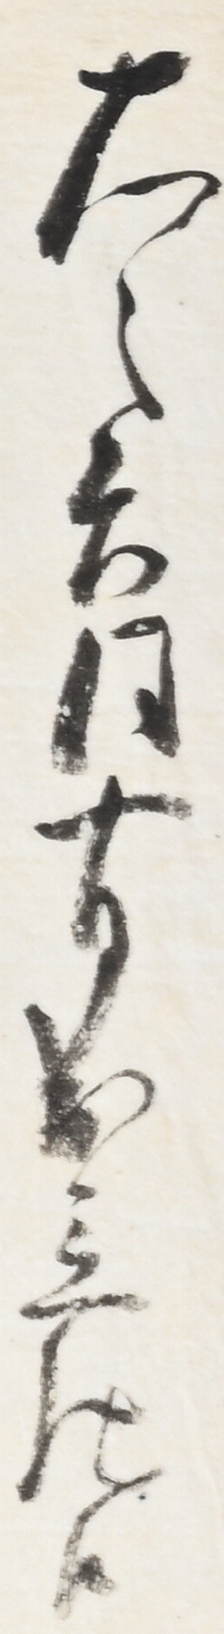右之者同十日出立仕候
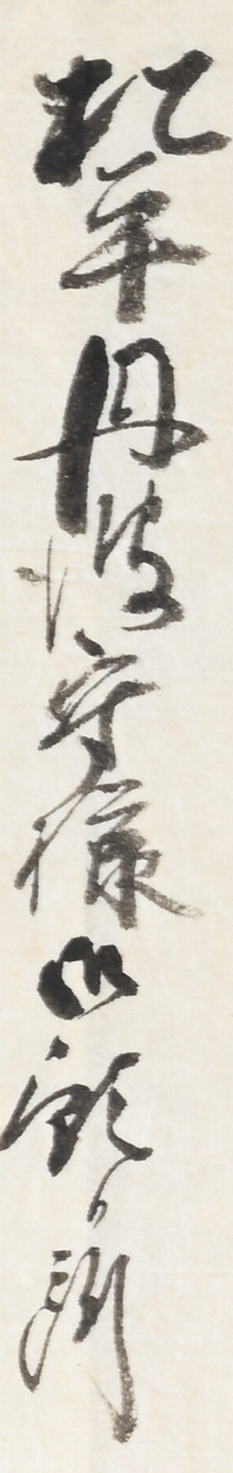松平丹波守様御領分所
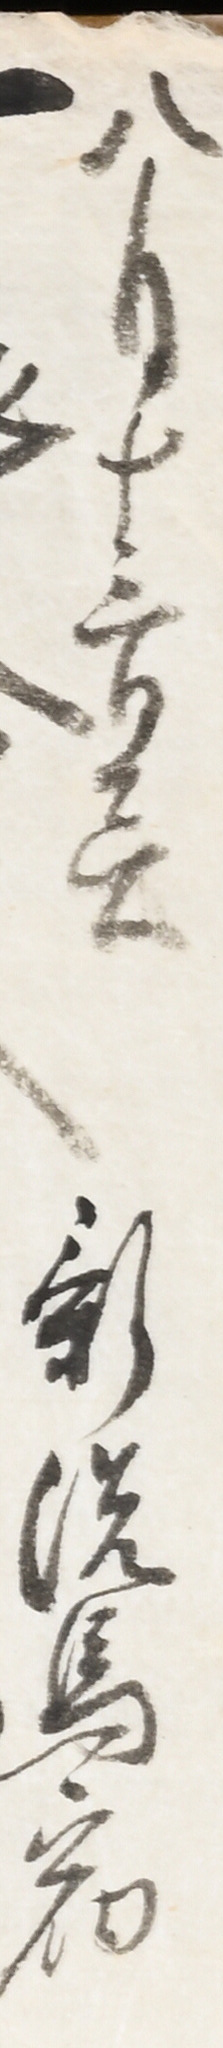八月十三日着新洗馬宿
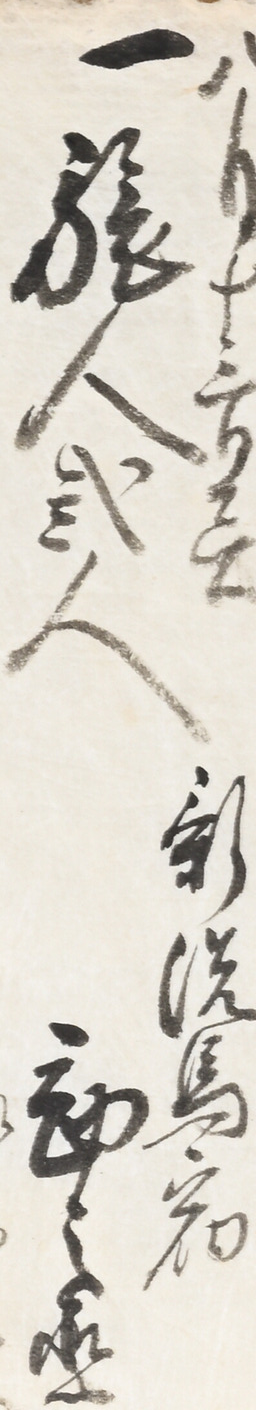一旅人弐人勘之丞
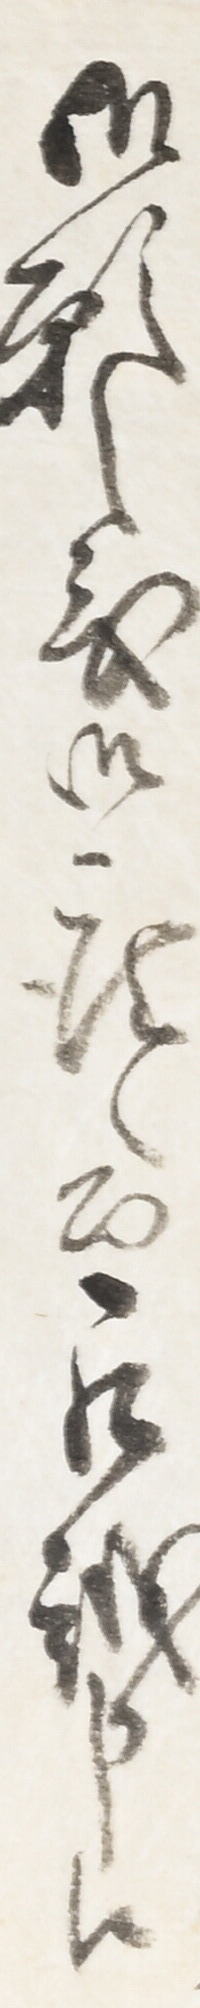御願之義御座候而罷越申候
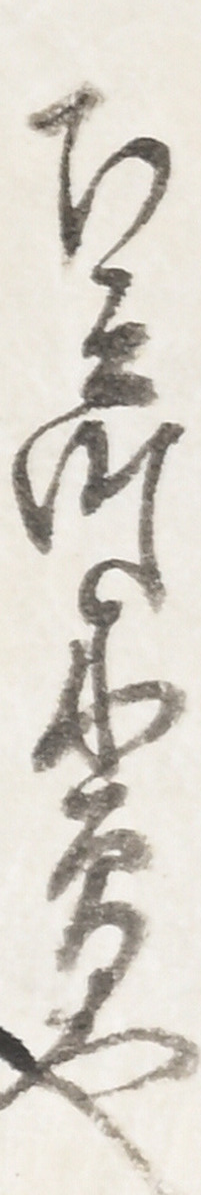下モ町木曽や
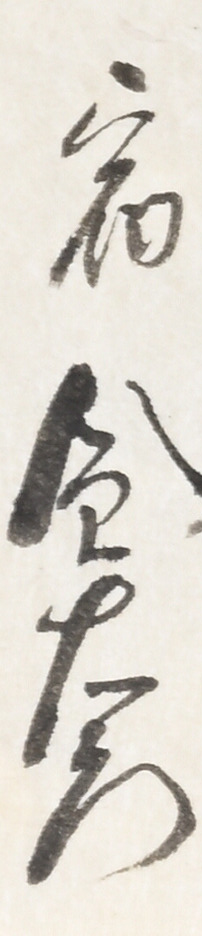宿金右衛門
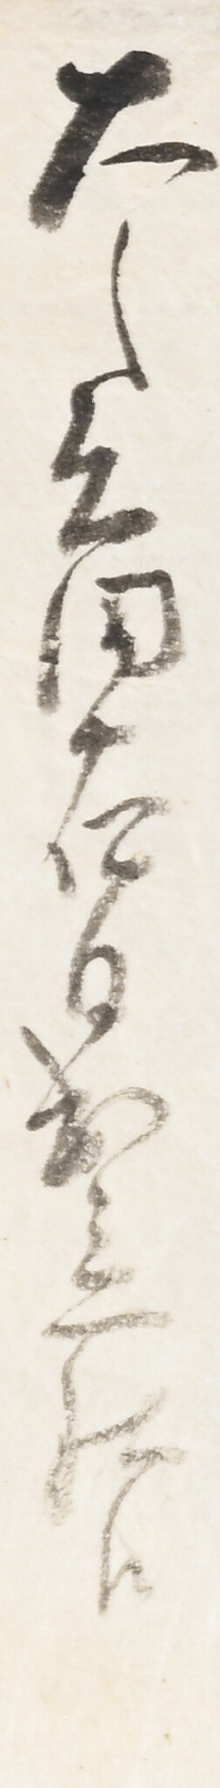右之者同十四日出立仕候
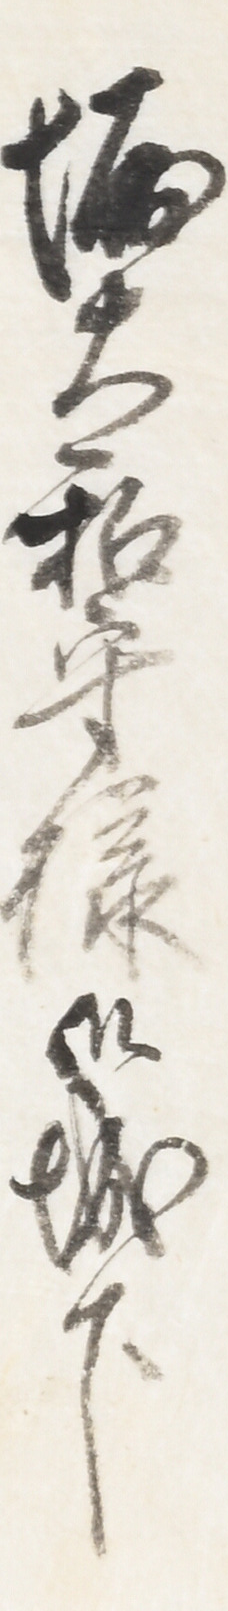堀大和守様御城下
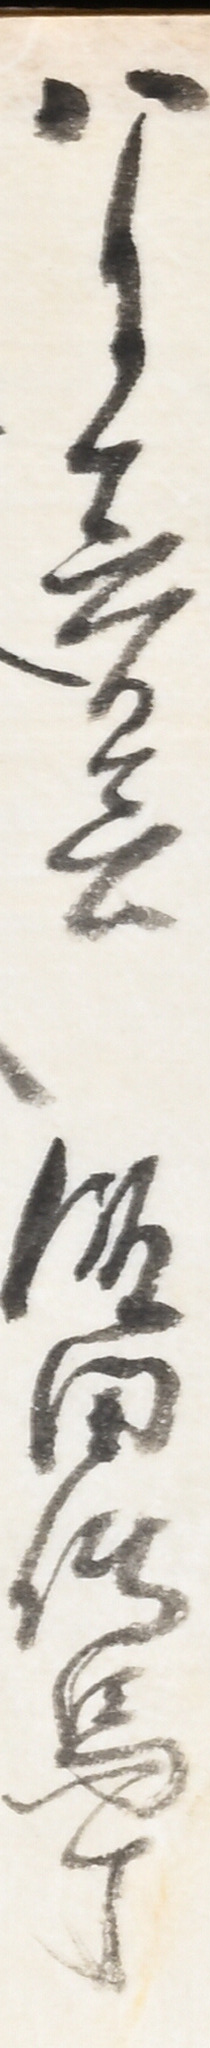八月十六日着飯田伝馬丁
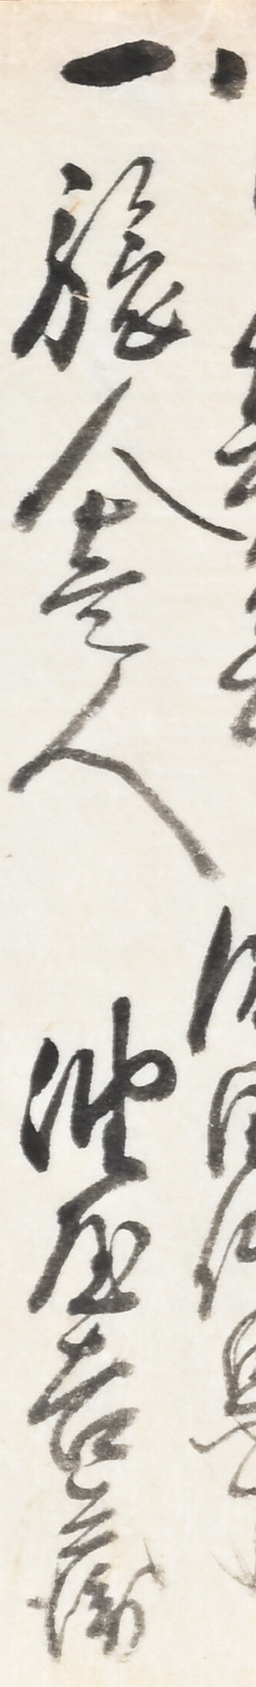一旅人壱人油屋吉兵衛
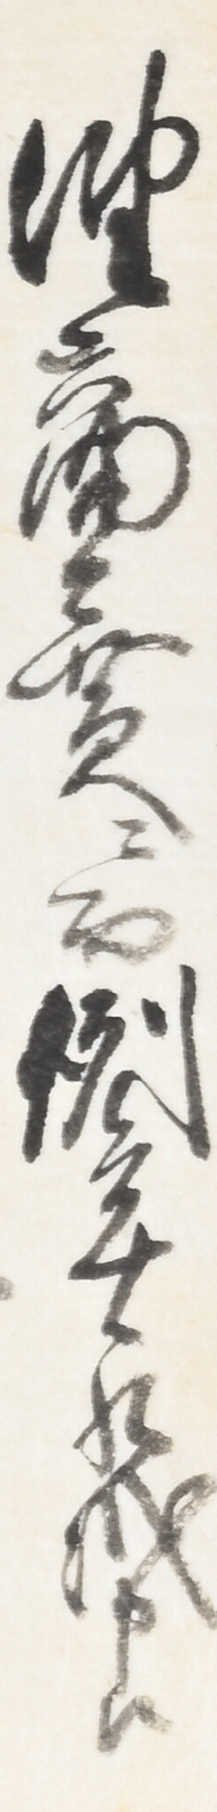油商売ニ而例年罷越申候
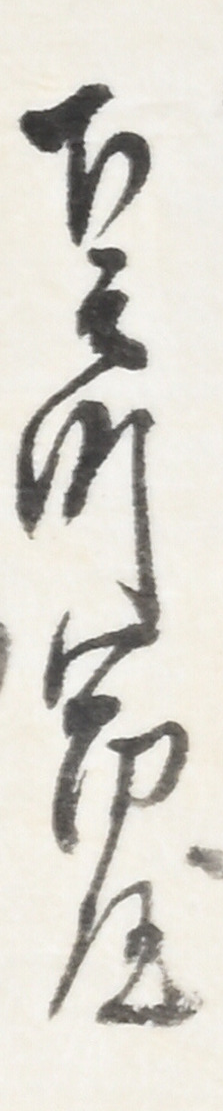下モ町冨屋
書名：旅人泊控帳
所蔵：伊那市立高遠町図書館・合同会社AMANE
